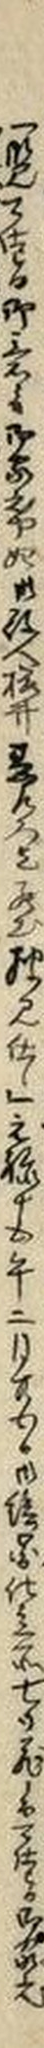一覧可仕旨御意ニ付御家老中始御役人桜井甚左衛門迄罷出披見仕候」元禄十五午二月廿五日御絵図仕立所七ツ蔵ニ而可仕旨御家老
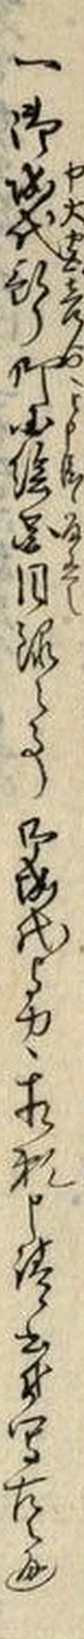一御城代預り御御国絵図目録之事御城代与力へ相頼申請候書付写左之通
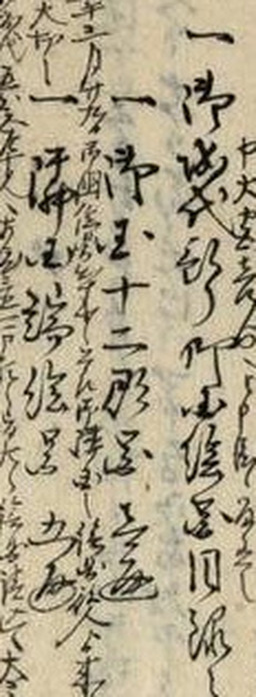一御国十二郡図壱通
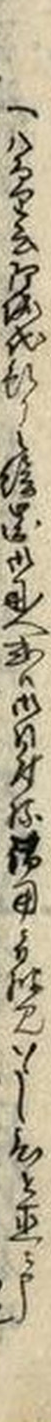一八百里言御城代預り之絵図御用人或ハ御目付様借用ニ付披見いたし度と直ニ申
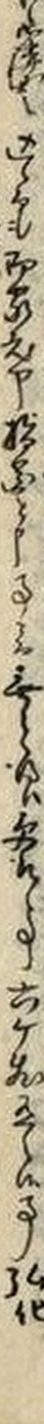込候而も御家老中指図と申事ニ而無之候得ハ受取候事六ケ敷有之候事弘化
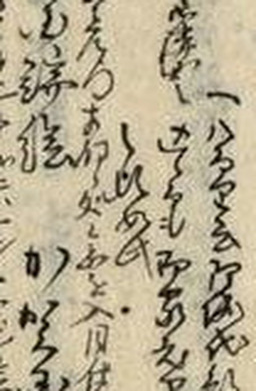之頃如此
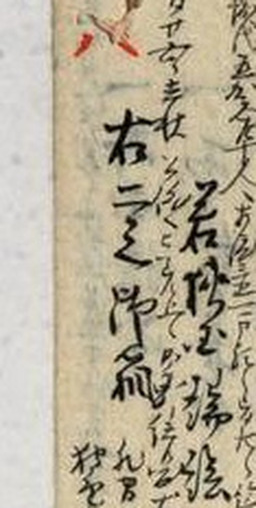右二之御箱
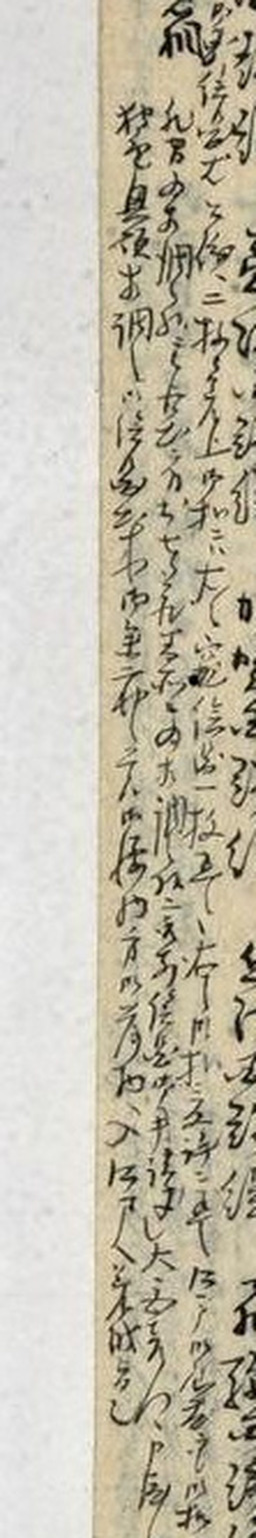狩野興碩相調之御絵図出来御参勤之節御腰物方御荷物へ入江戸へ差越旨也

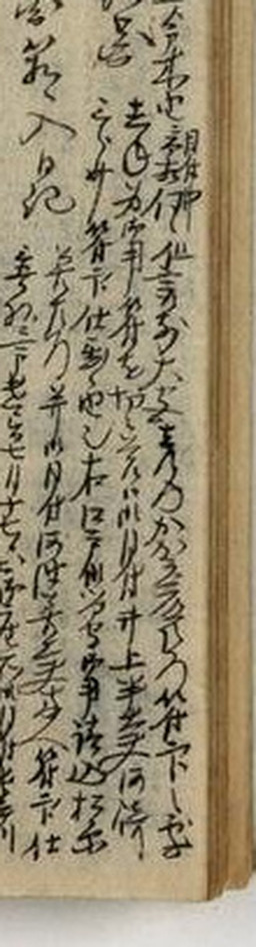去年為御用符を切候節ハ御目付井上半太夫川崎
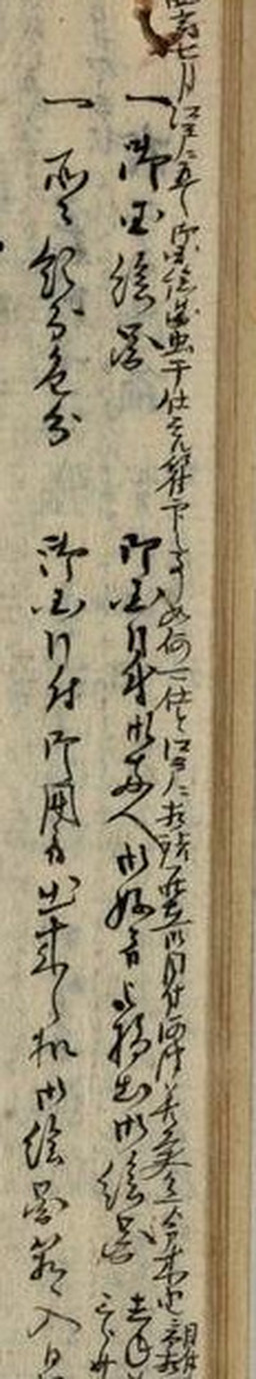一御国絵図御国目付御両人御好ニ付被指出御絵図
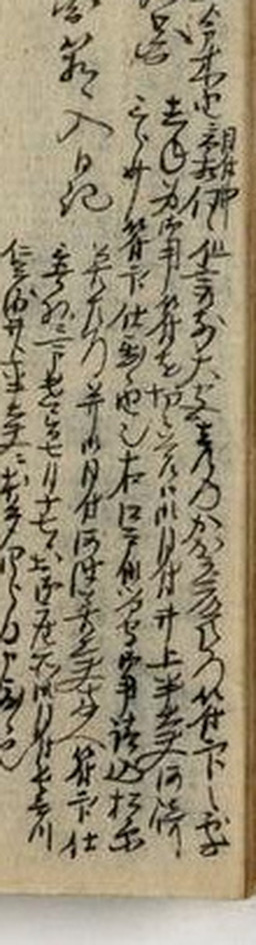三郎介符印仕置候由也右江戸御留守御用請込松原
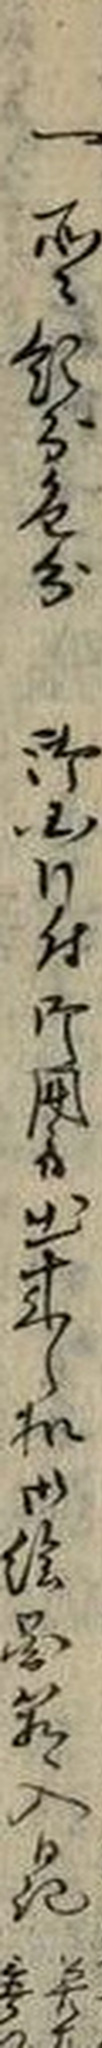一所々領分色分御国目付御用ニ付出来候控御絵図箱へ入日記
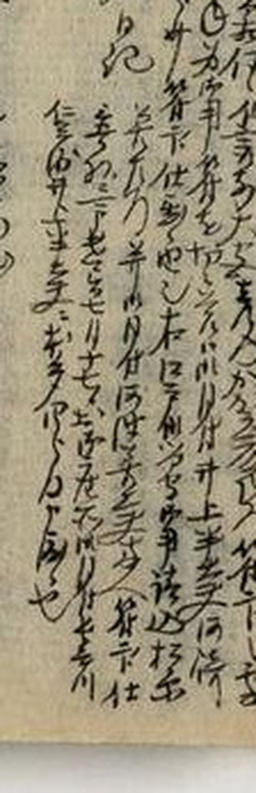善左衛門幷御目付河津善太夫両人符印仕
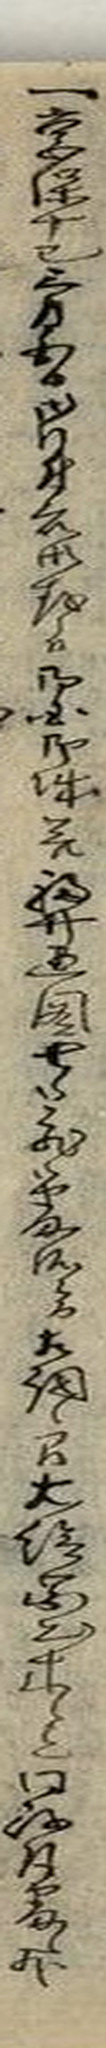一享保十巳三月五日御目付衆御越ニ付御国御城幷福井画図七ツ蔵御番所ニ而相調候間右絵図出来候迄同役月番之外
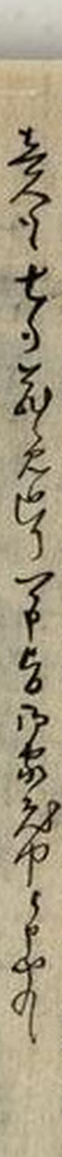壱人ツヽ七ツ蔵へ見廻り可申旨御家老中被申聞候

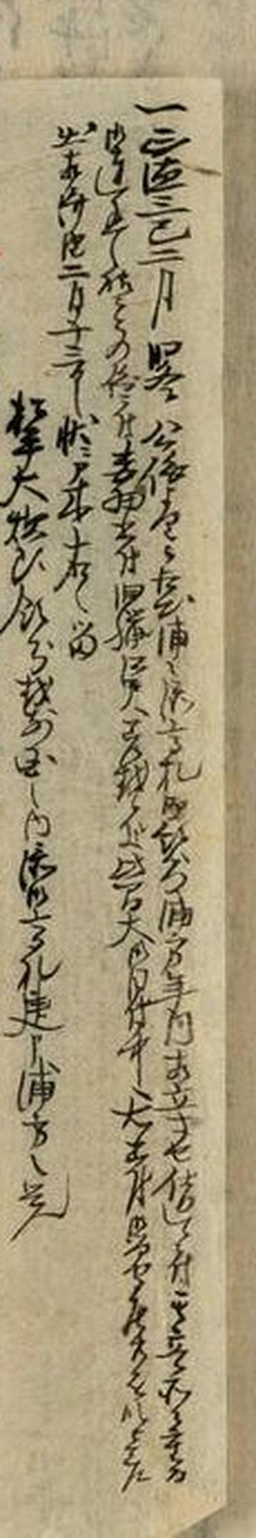御達有之様ニとの儀ニ付委細書付旧臘江戸へ差越候処此間大御目付中へ右書付御留守居共を以被差
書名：御国他国諸事之部
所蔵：福井県文書館 Fukui Prefectural Archives
